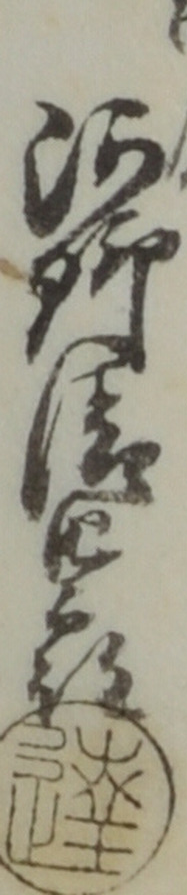河野清兵衛
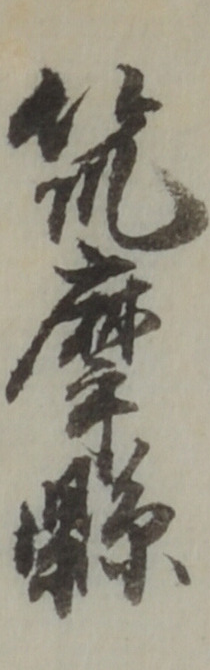筑摩縣
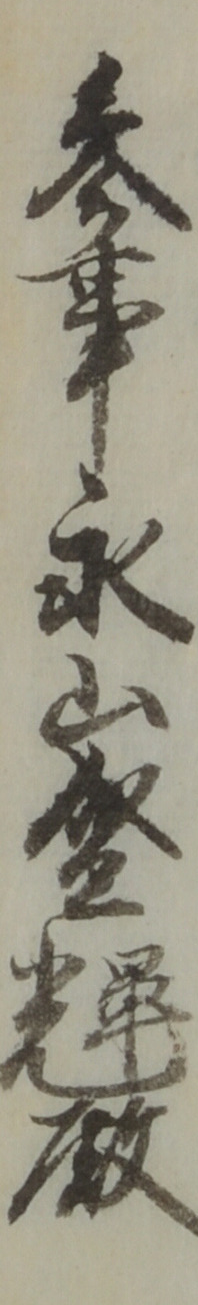参事永山盛輝殿
